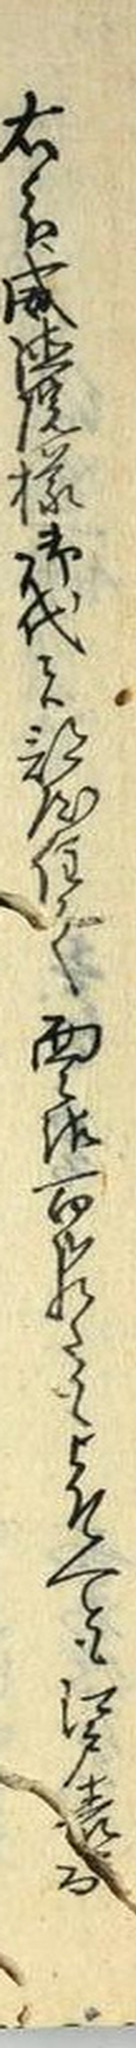右ニ付威徳院様御代ニハ部屋住之面々銀百弐拾匁ツゝ被下候へとも江戸表ニ而
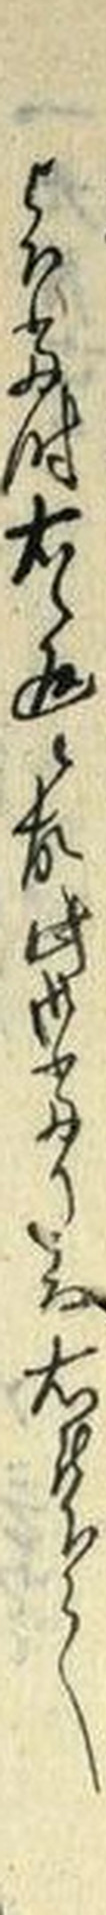被下当時右之通候故此御当りニ而右被下之
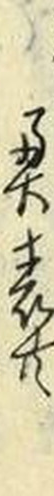奥表共
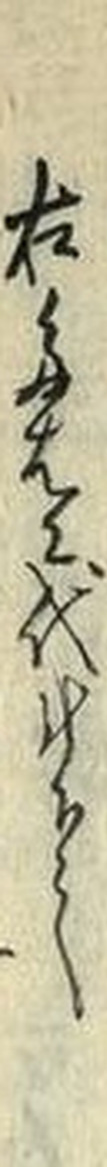右たはこ代被下之
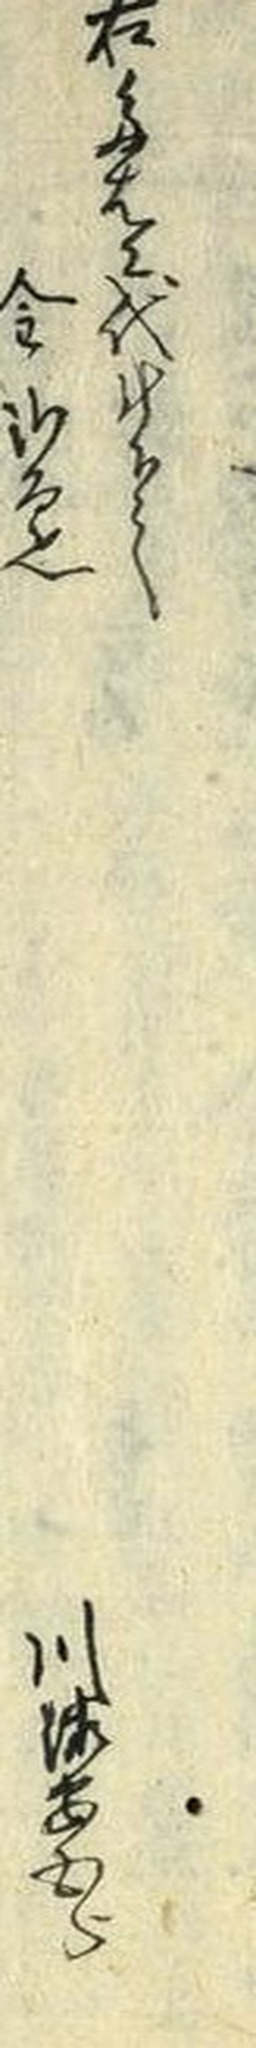金弐百疋川瀬安五郎
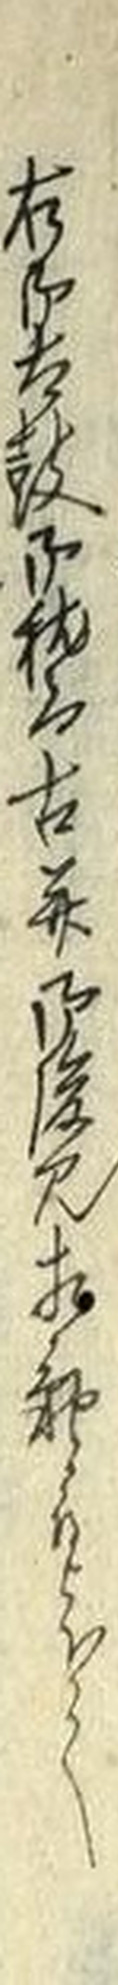右御太鼓御稽古并御後見相勤候付被下之
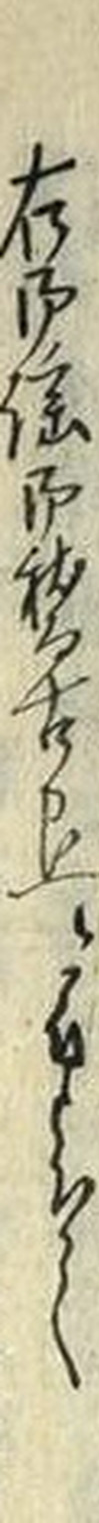右御謡御稽古申上候ニ付被下之
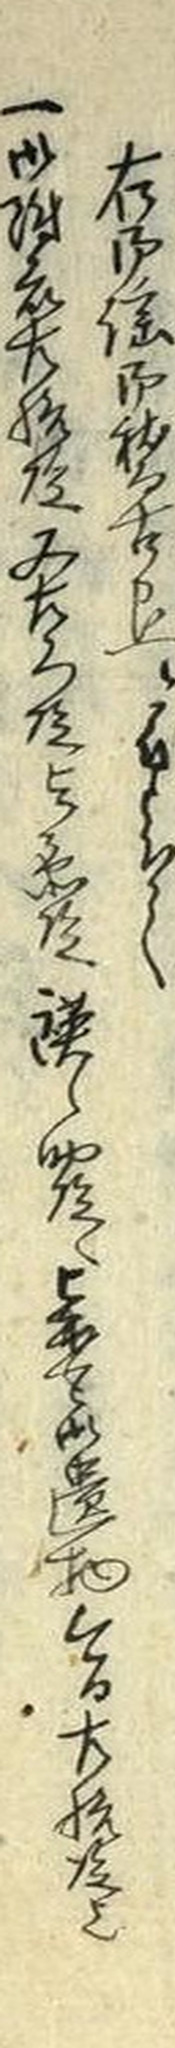一御附衆左膳殿又左衛門殿与兵衛殿鍈之助殿へ被遣候御遺物今日左膳殿迄
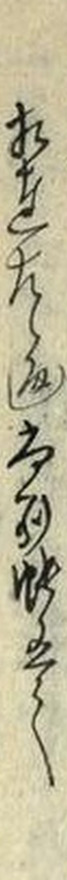相達左之通尚別帳有之
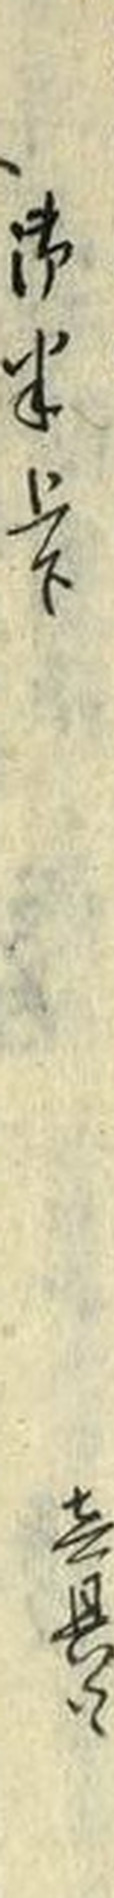御半上下壱具ツヽ

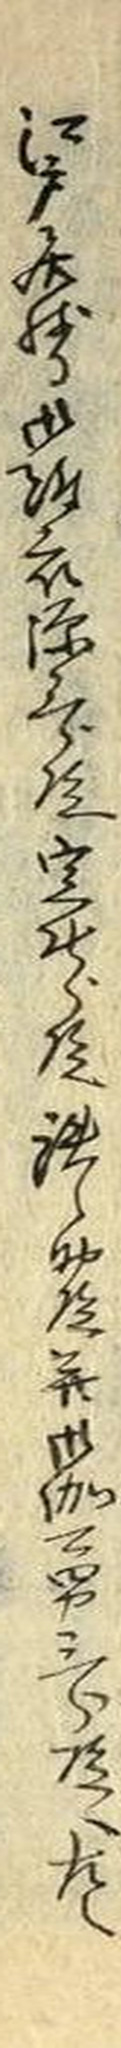江戸居残り御附衆源三郎殿定次郎殿鉄之助殿并御伽勇三郎殿へ左之
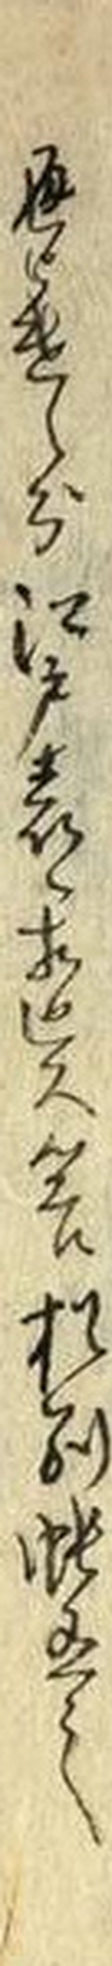通被遣候分江戸表へ相廻ス筈猶別帳有之
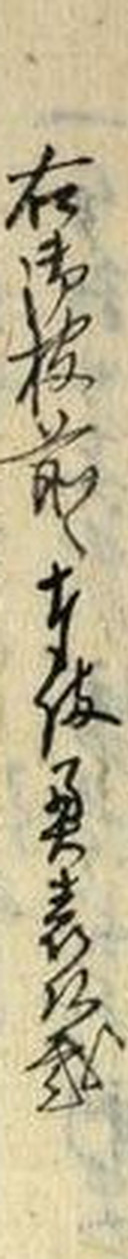右御棺前奉備奥表頂戴
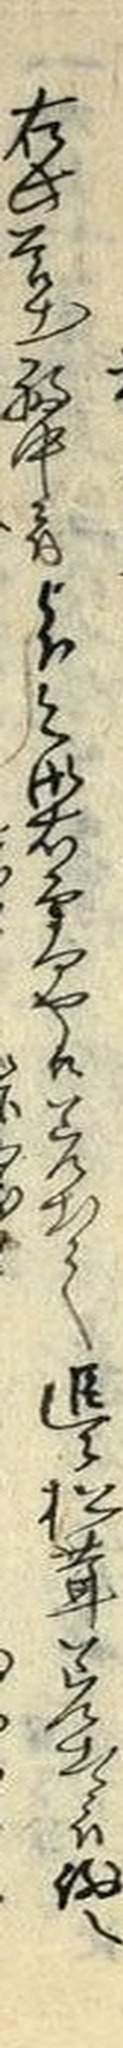右此節出福中ニ付被下之御右筆部や江差出之追々松茸差出候ニ付例之
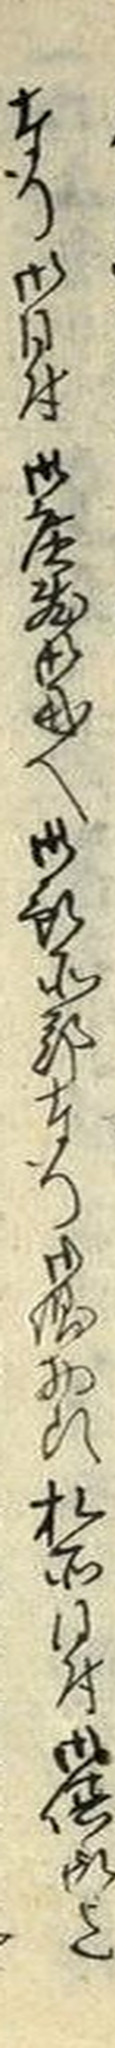奉行御目付御広敷御用人御預所郡奉行御側物頭札所目付御供頭迄
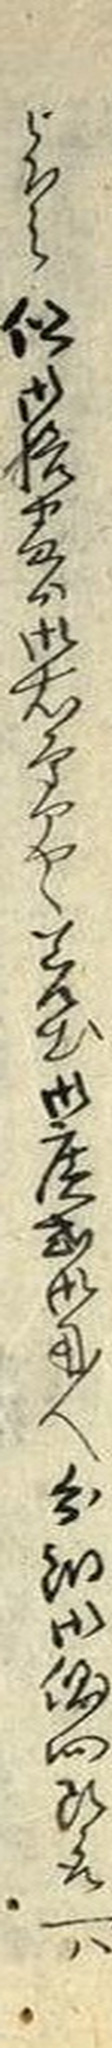被下之但御膳番ゟ御右筆部やへ差出御広式御用人分納御側向頭取へハ
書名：少傅日録抄（斉善付側向頭取日記、江戸并道中、初入在国、逝去後…
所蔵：福井県文書館 Fukui Prefectural Archives
